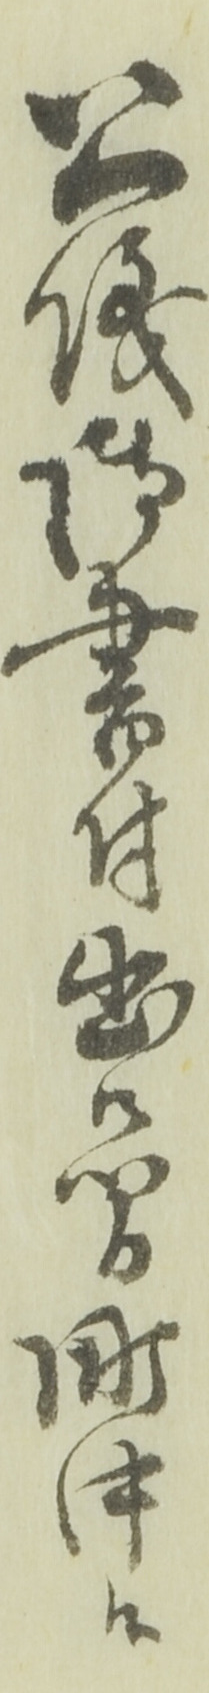公義御書付出候間町中江
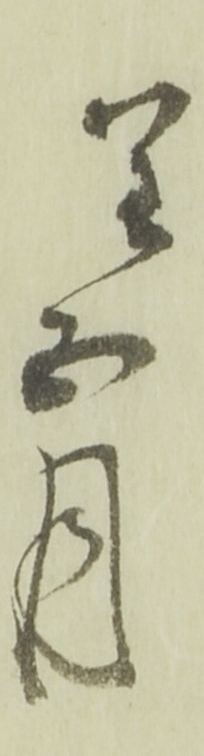閏五月

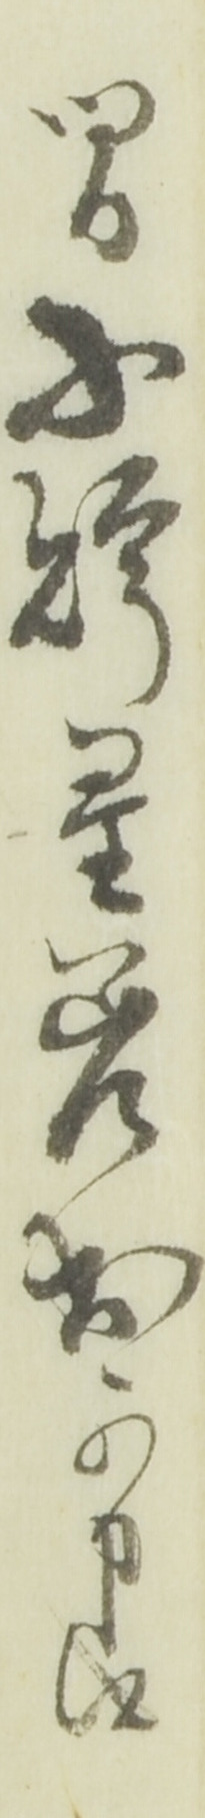間不貯置差出可申候
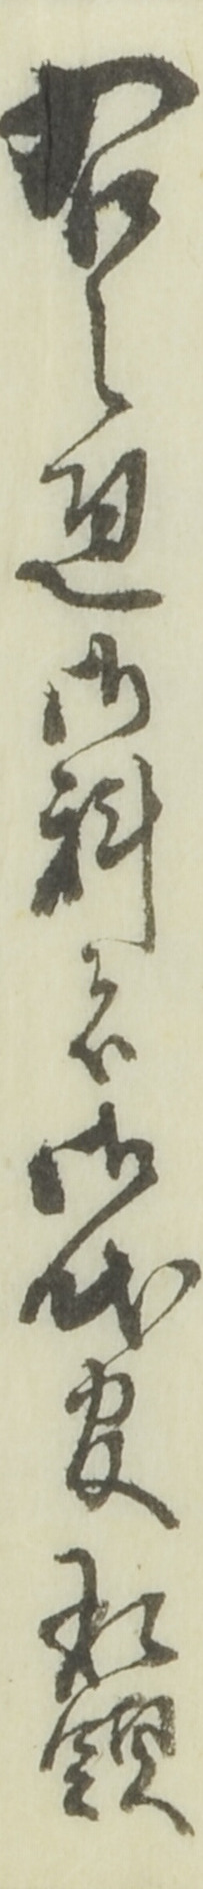右之通御料者御代官私領
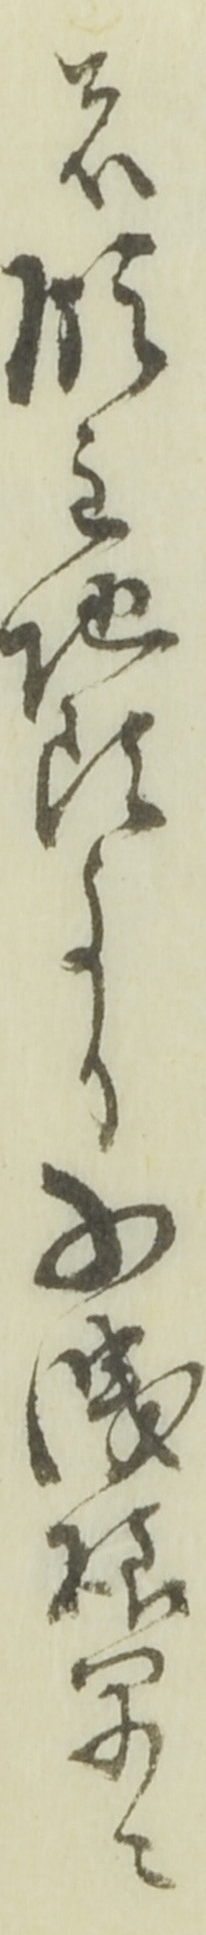者領主地頭より不洩様早々
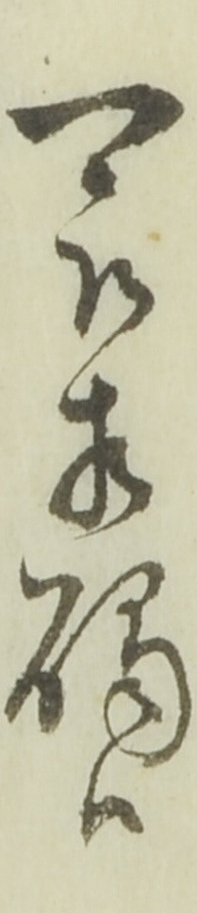可被相触候
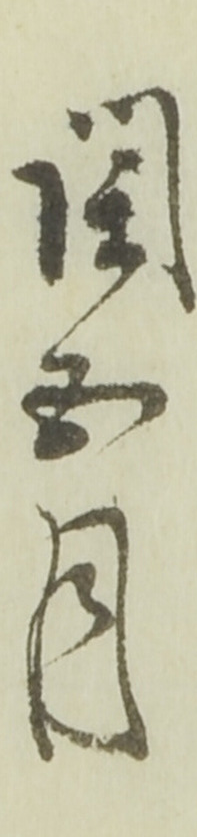閏五月
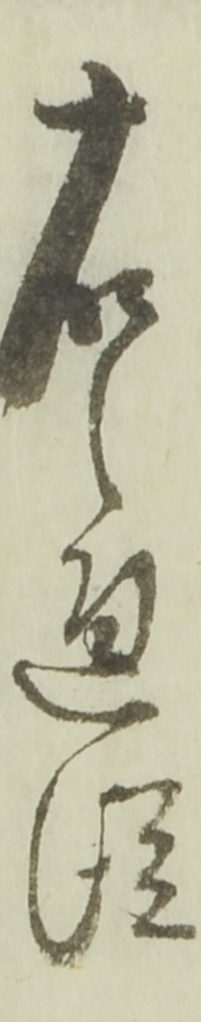右之通従
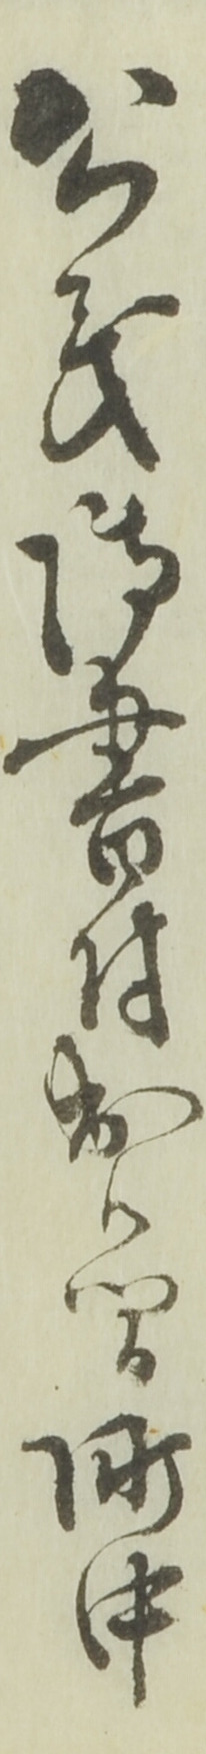公義御書付出候間町中
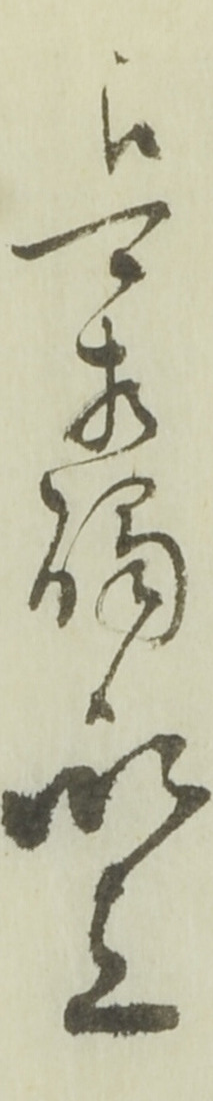江可相触候以上
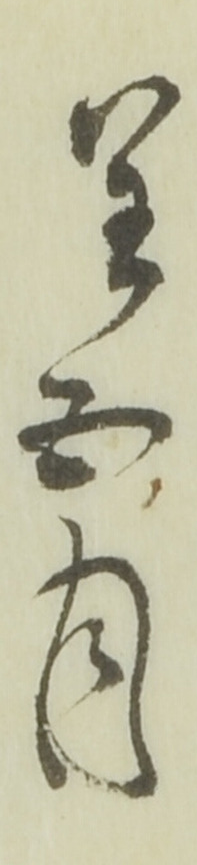閏五月
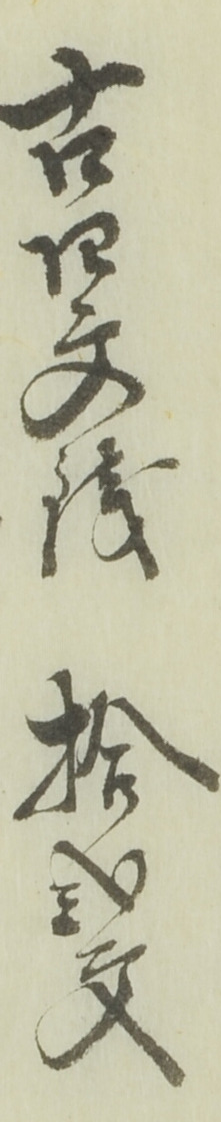古四文銭拾弐文
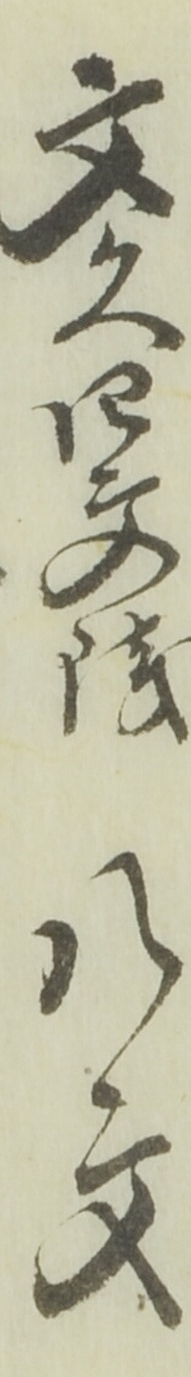文久四文銭八文
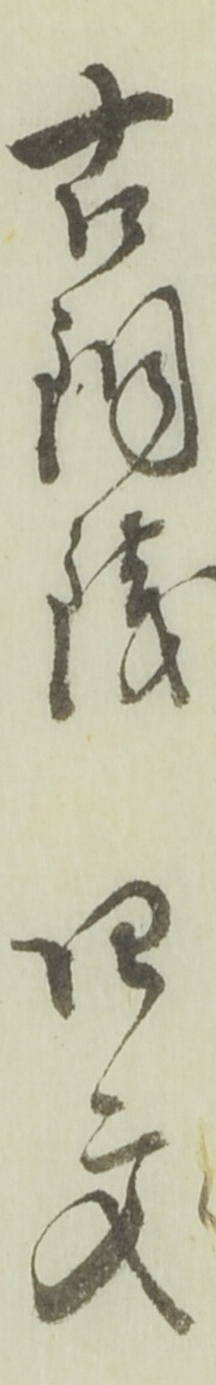古銅銭四文
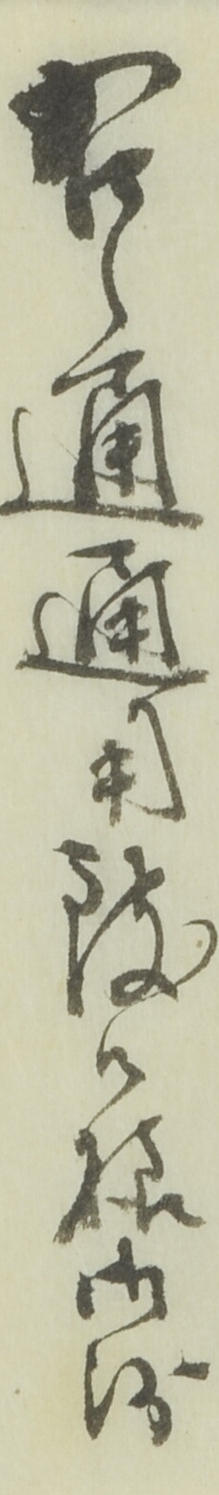右之通通用致候様御沙
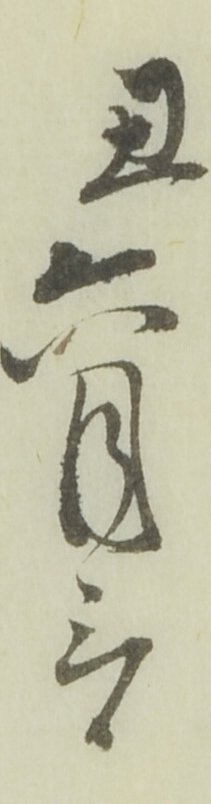丑六月三日
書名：御触書御書附控帳
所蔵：伊那市立高遠町図書館・合同会社AMANE
